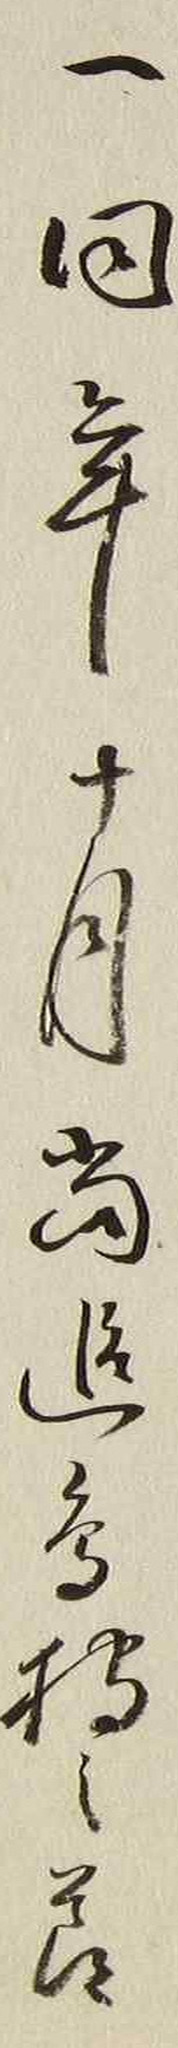一同年十月当追鳥狩之節
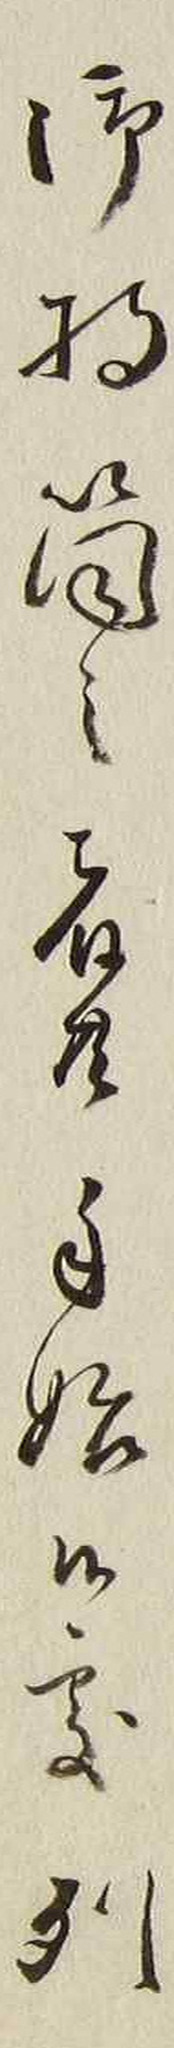御持筒之者共手始候処列
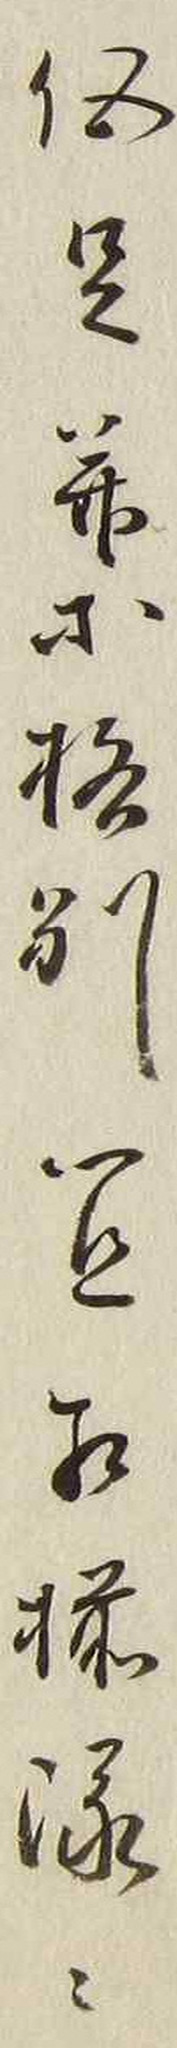伍足并等格別宜相揃隊々

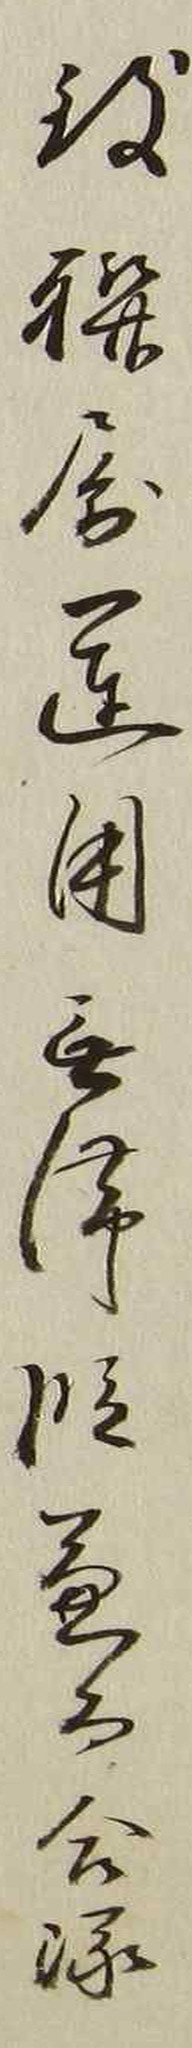致聯属運用無滞段兼而合隊
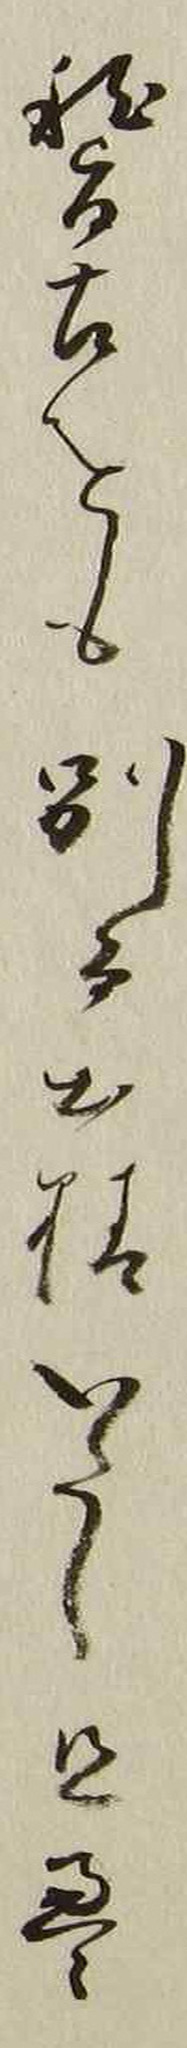稽古をも別而出精いたし旦畳
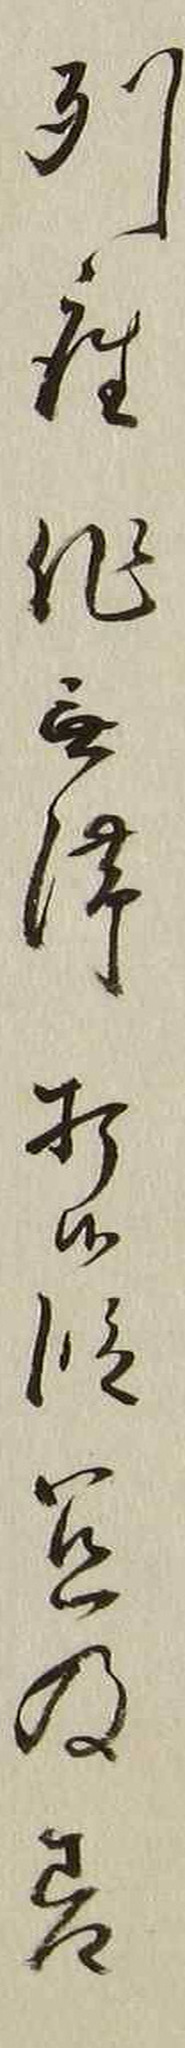列座作無滞打候段宜及差
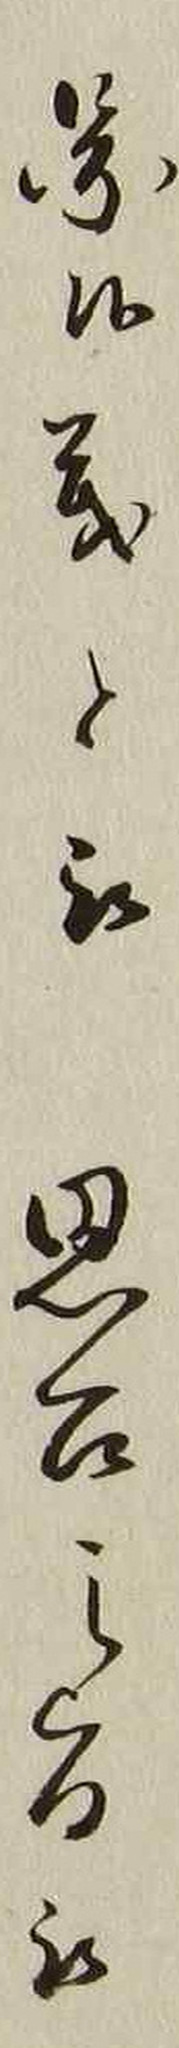図候義と被思召之旨被
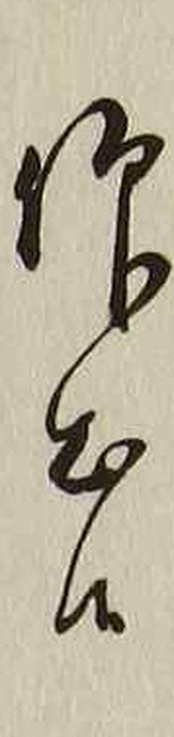仰出候
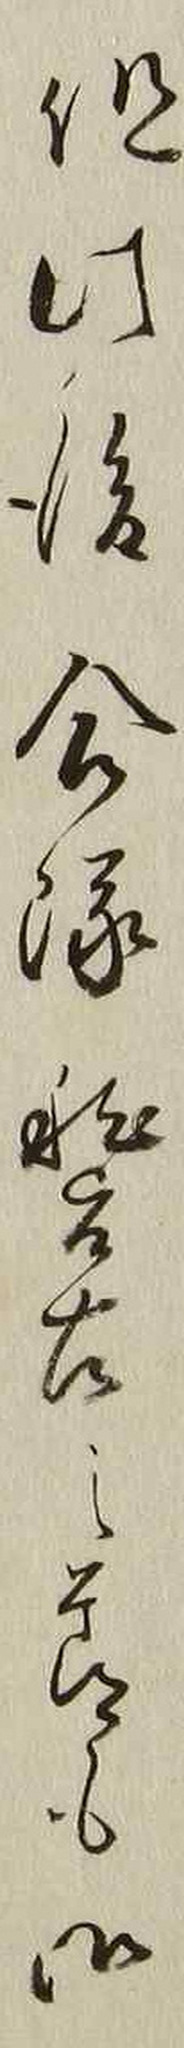但此後合隊稽古之節も御
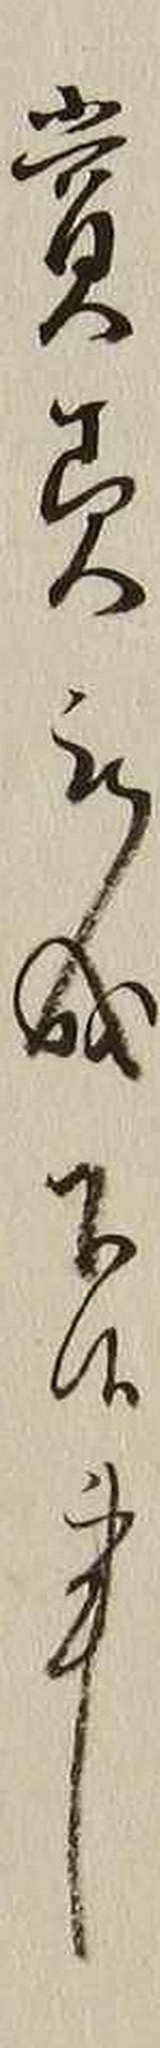賞美被成下候事
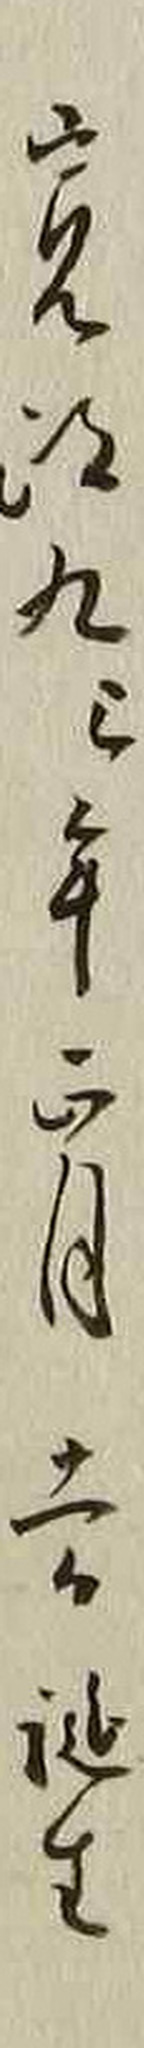寛政九巳年正月十一日誕生
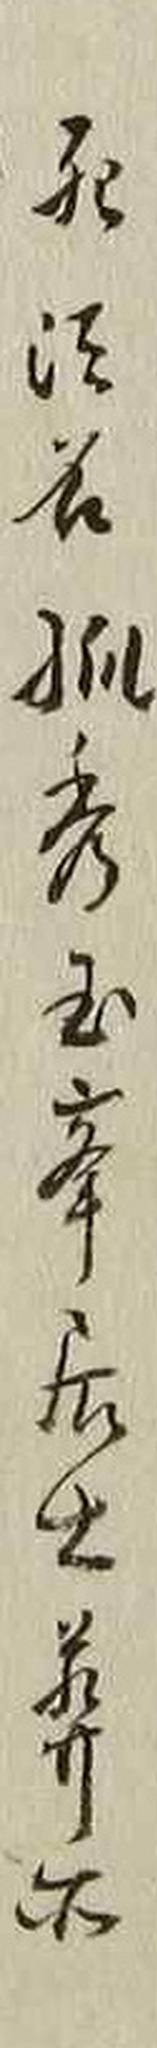死法名抓秀玉峯居士葬所
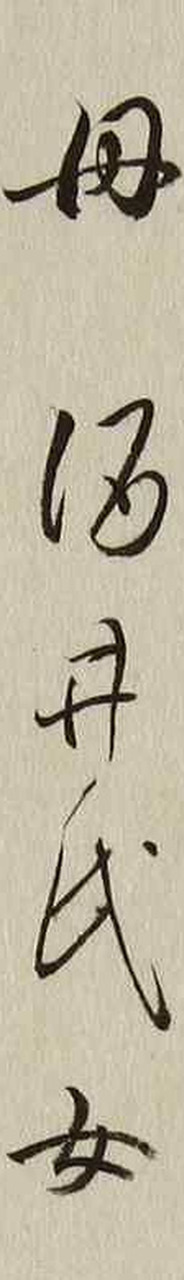母酒井氏女
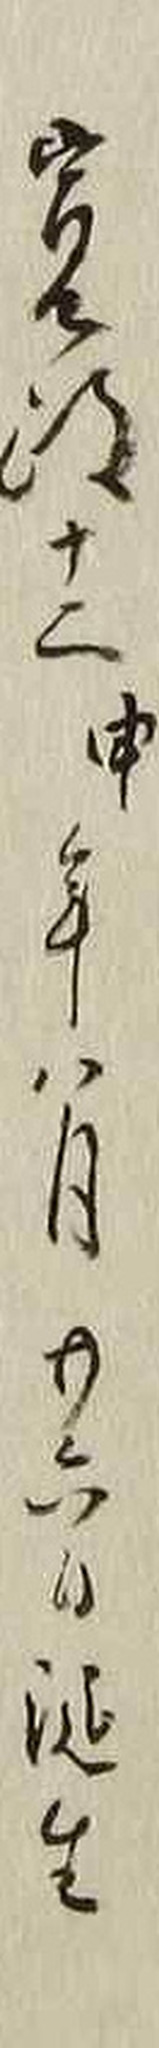寛政十二申年ハ月廿六日誕生
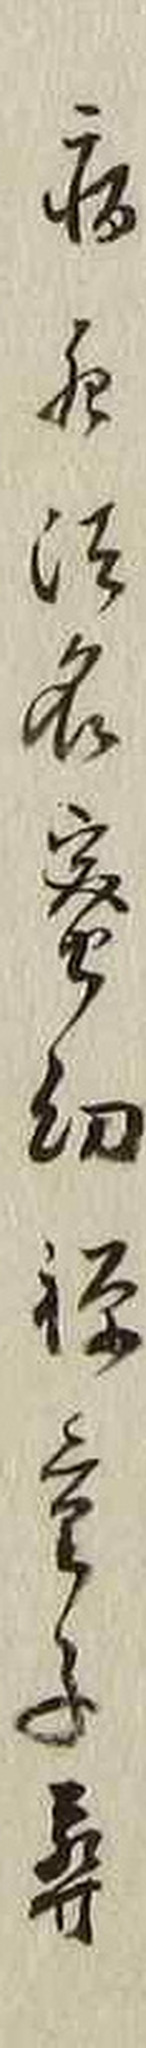病死法名蜜幼禅童子葬
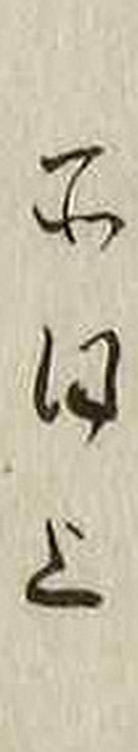所同上
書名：諸士系譜　巻之159　な之部1
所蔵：会津若松市立会津図書館
